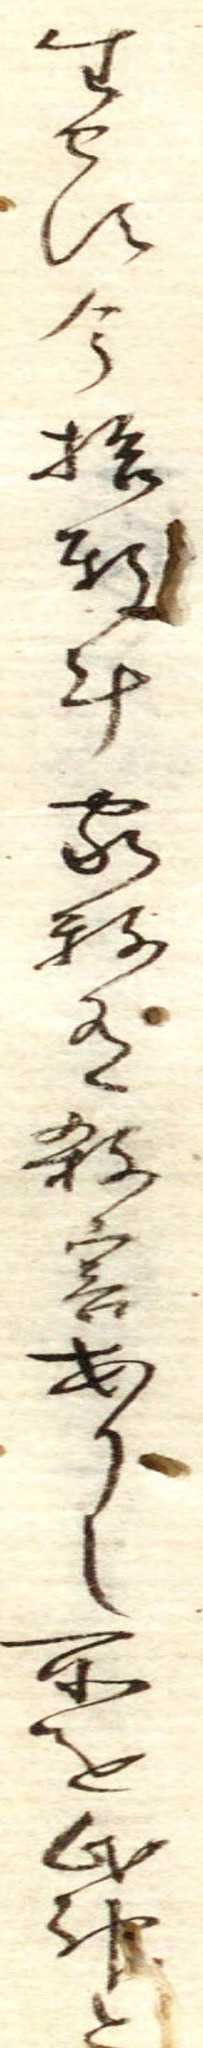生せす今拾軒斗家数有殺害ありし所を氏神と
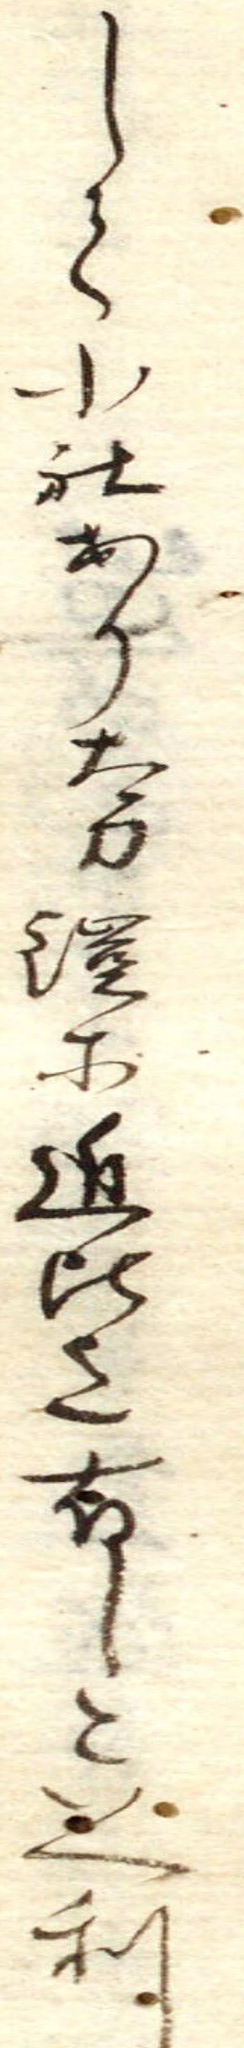して小社あり太刀環等近頃迄有しといへり

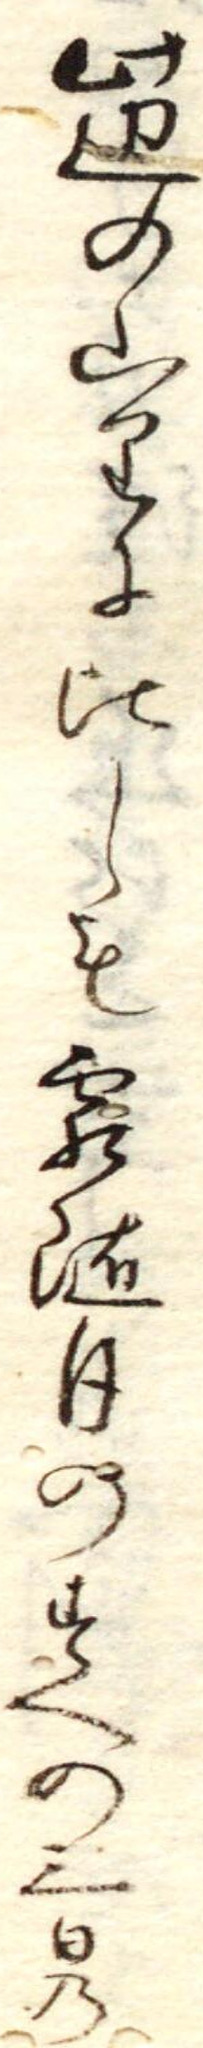此辺の山里に比しも霜随月のすへの三日の
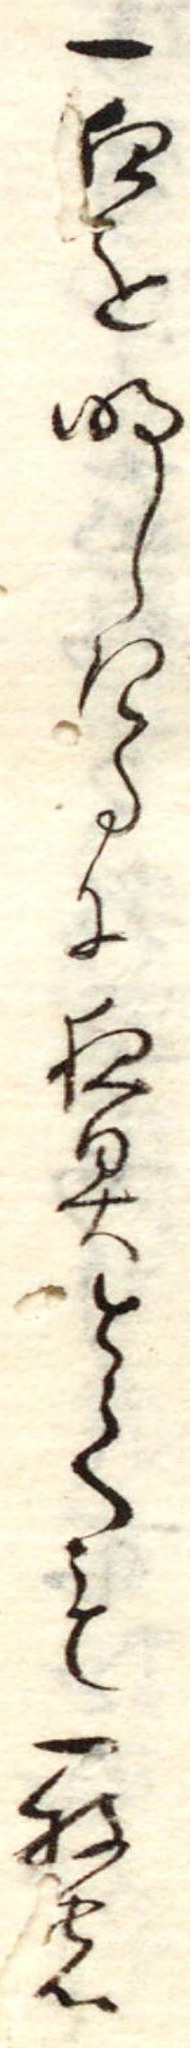一夜を明しけるに夜具とても一枚の
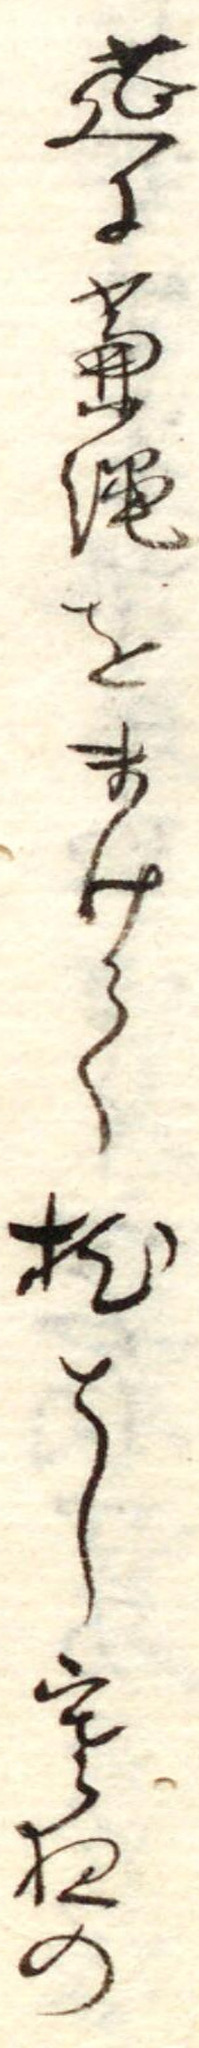莚に兼縄をまけて枕とし寒夜の
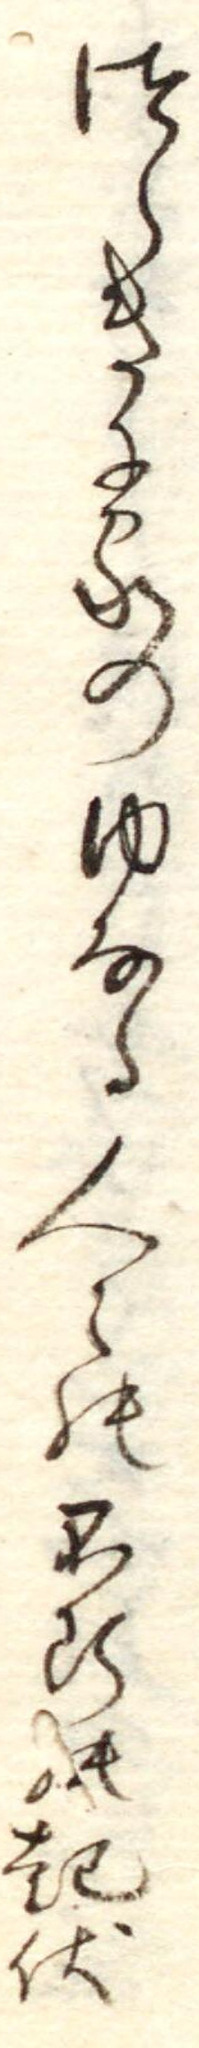つらきに家の内なる人々の不断の起伏
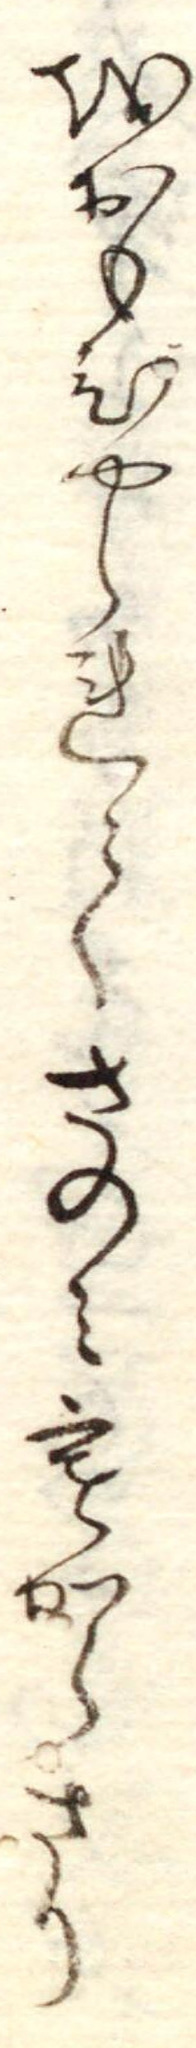をおもひやられてさのみ寒からさり
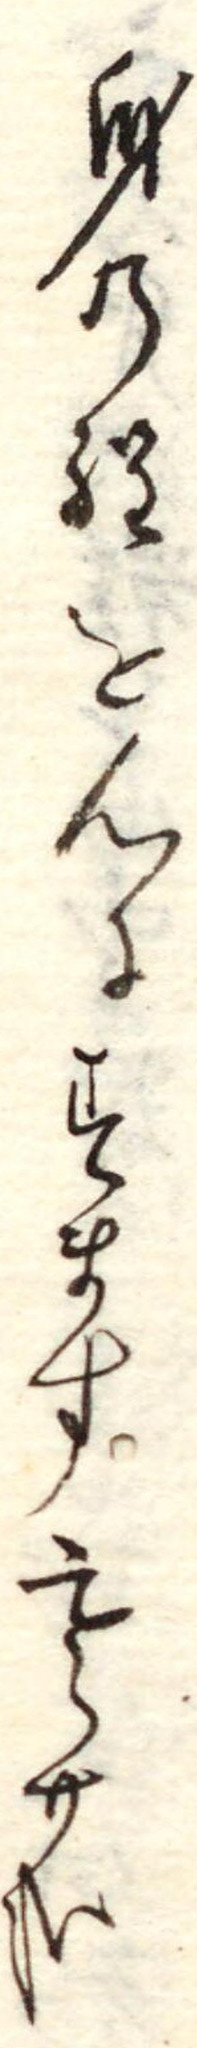身の程を心にすます寒さ哉
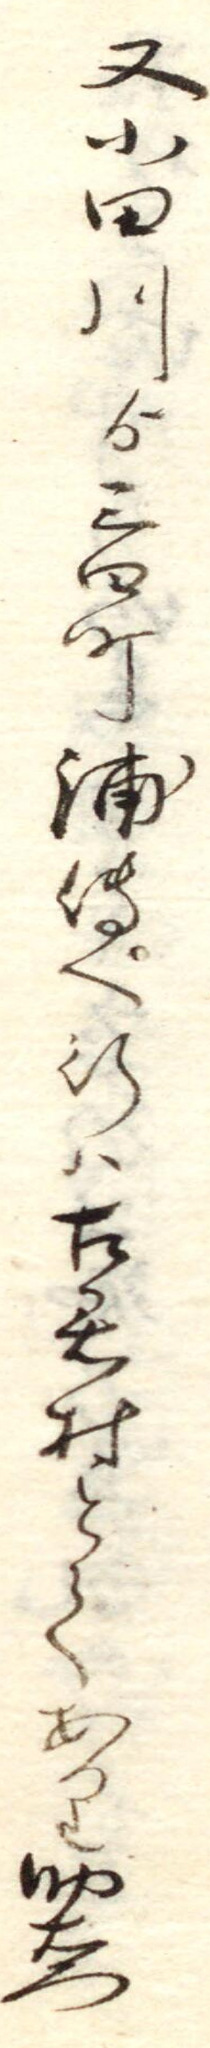又小田川ゟ三田町浦伝へ行は古君村とてあり助右衛門
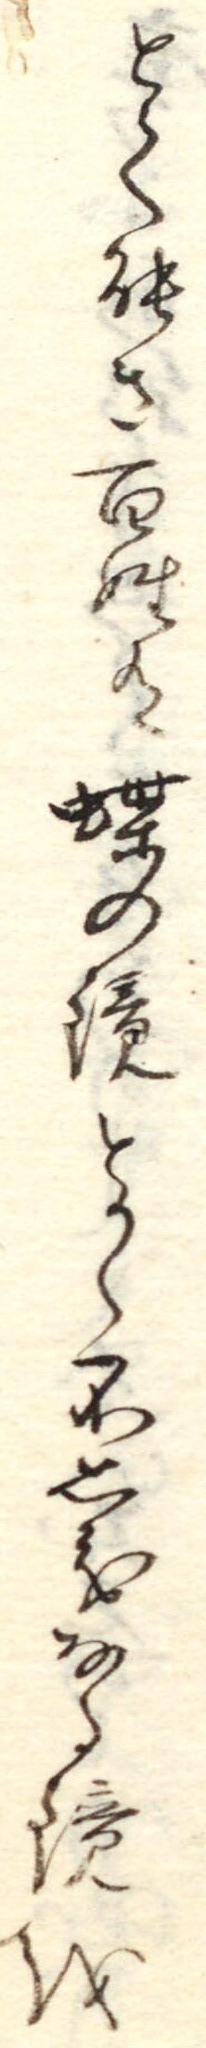とて能き百姓有蝶の鏡とて不思義なる鏡を
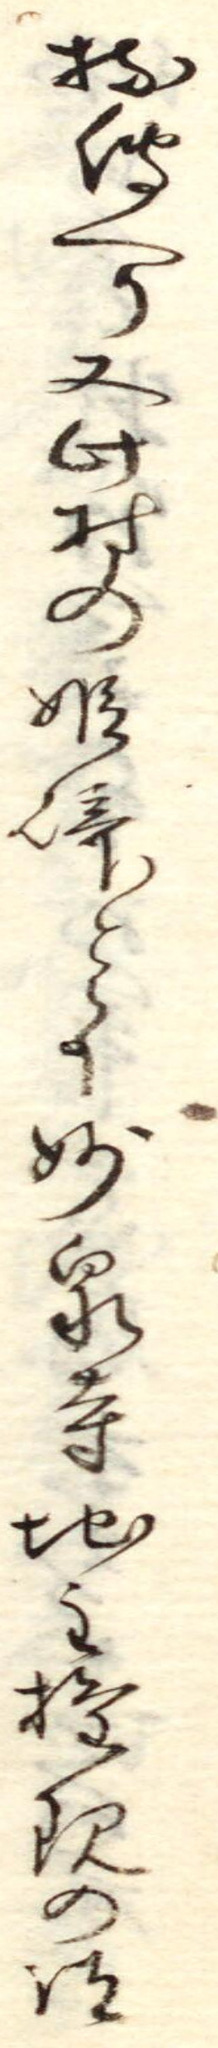持伝へり又此村の姫崎とて妙泉寺地主権現の御
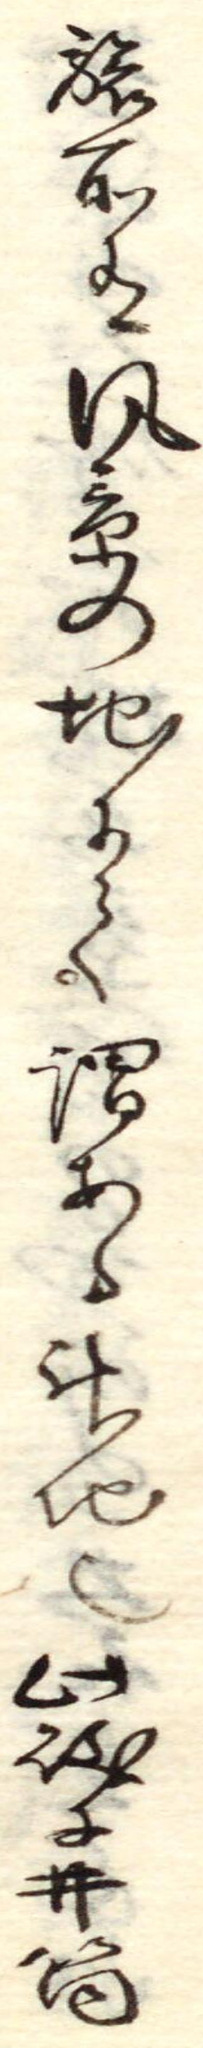旅所有風景の地にて謂ある神地也此礒に井筒
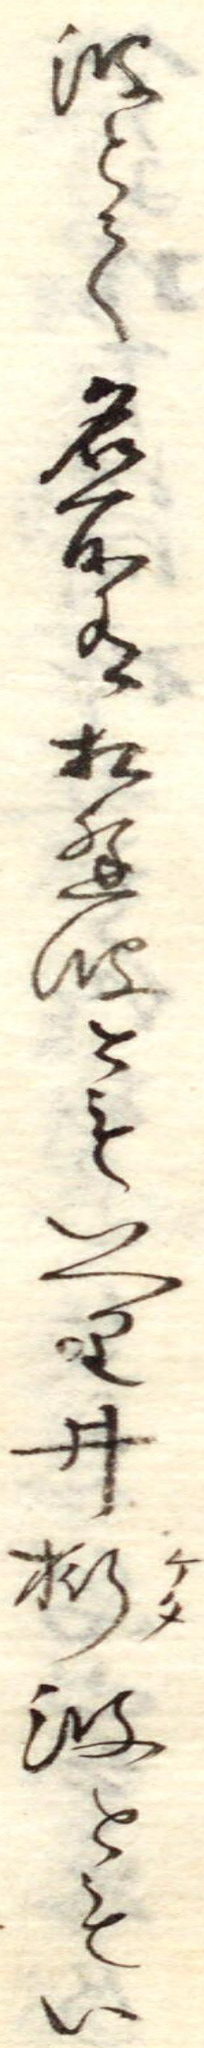波とて名所有相逢波ともいへり井桁波ともい
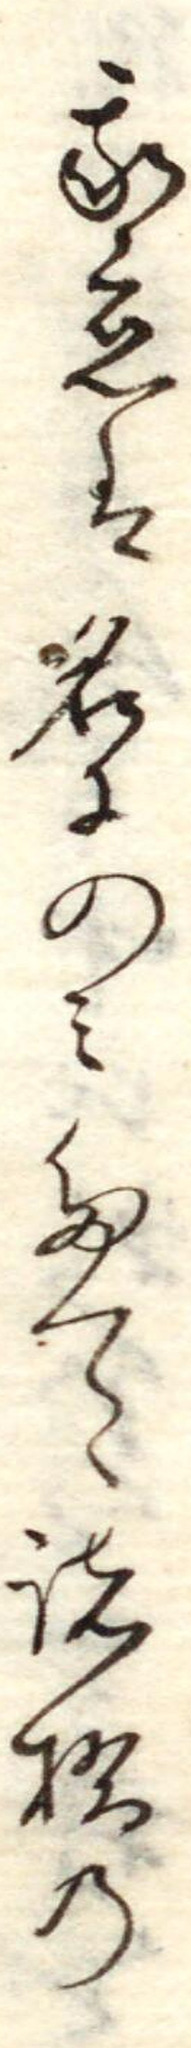我意は名のみたてゝ諸橋の
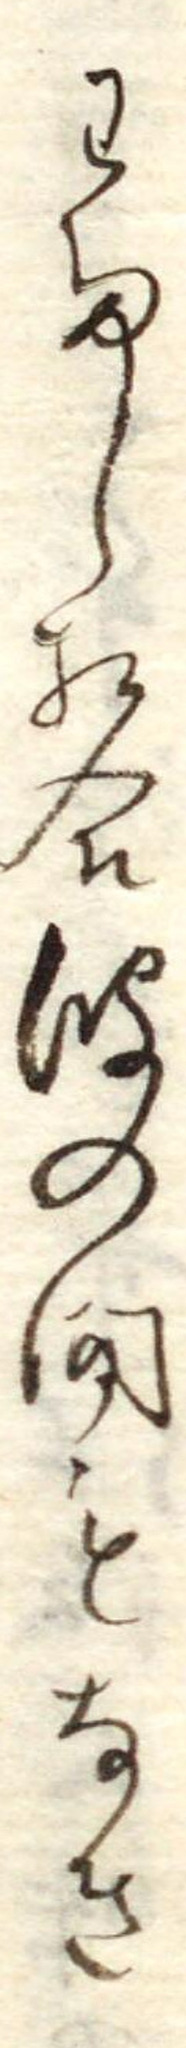わたし相合波の間もなき
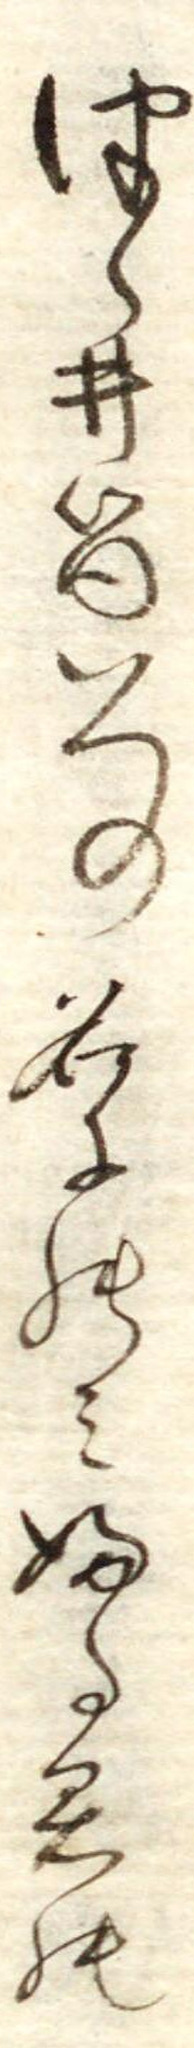つゝ井筒いつの名にのみふる君の
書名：能登名跡誌
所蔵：Ishikawa Prefectural Library
